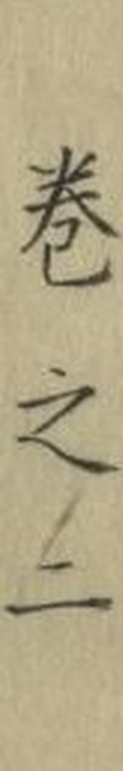巻之二
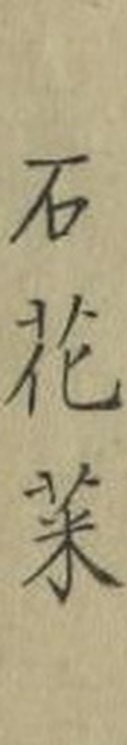石花菜

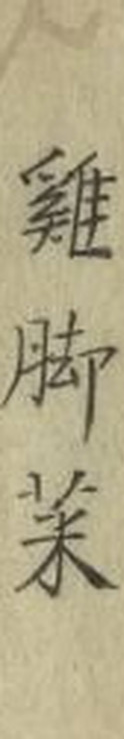雞脚菜
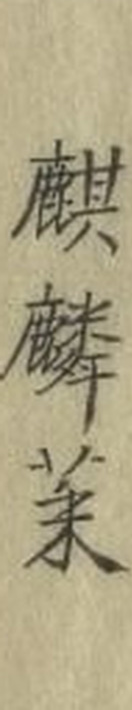麒麟菜
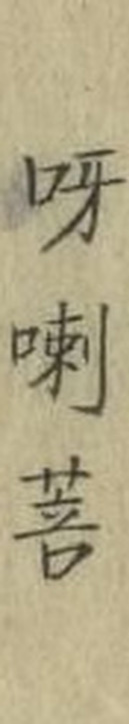呀喇菩
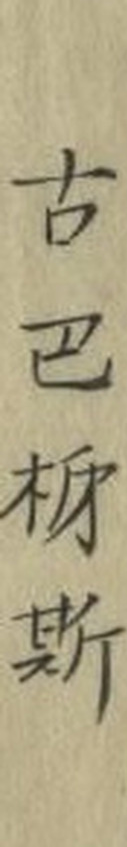古巴栃斯
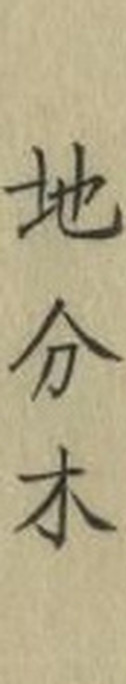地分木
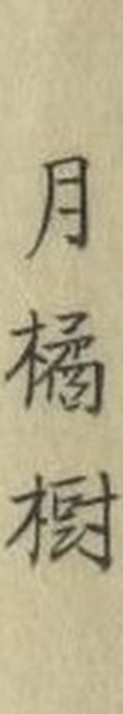月橘樹
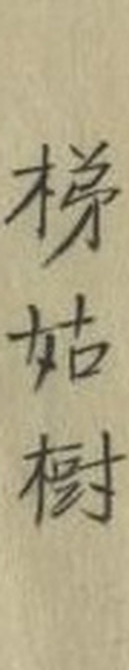梯姑樹
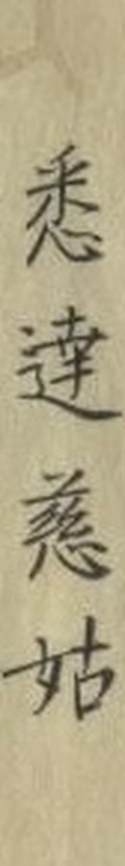悉達慈姑

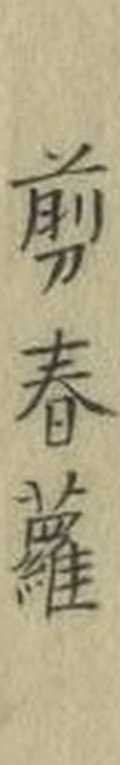剪春蘿
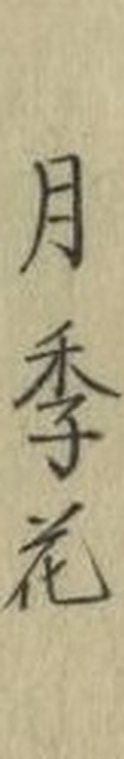月季花
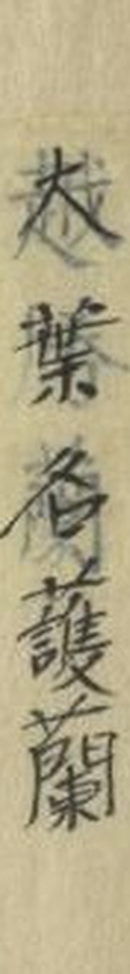大葉名護蘭
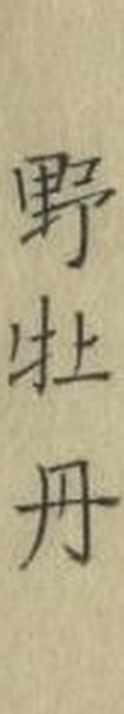野牡丹

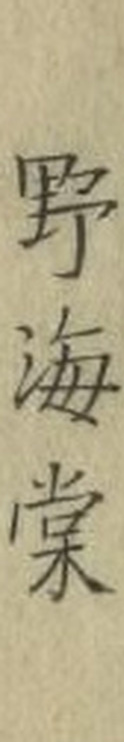野海棠
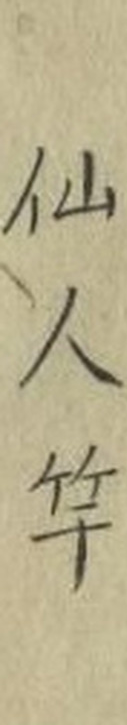仙人竿
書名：中山伝信録物産考 地
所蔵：University of the Ryukyus Library
